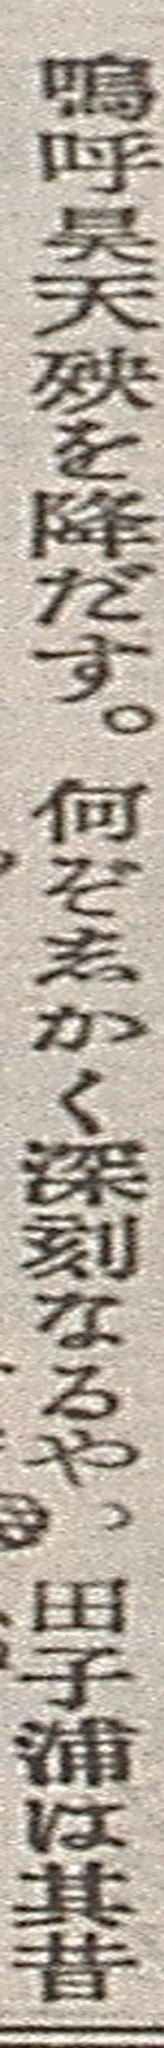嗚呼昊天殃を降だす。何ぞしかく深刻なるや。田子浦は其昔
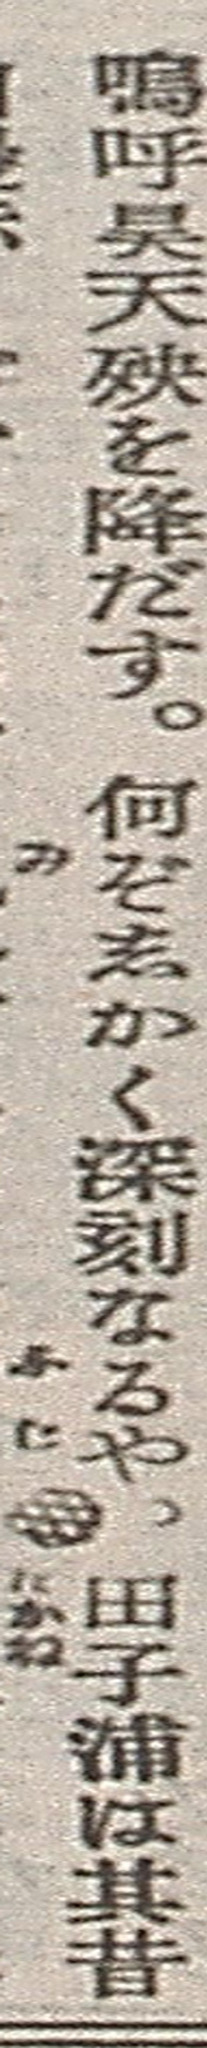嗚呼昊天殃を降だす。何ぞしかく深刻なるや。田子浦は其昔
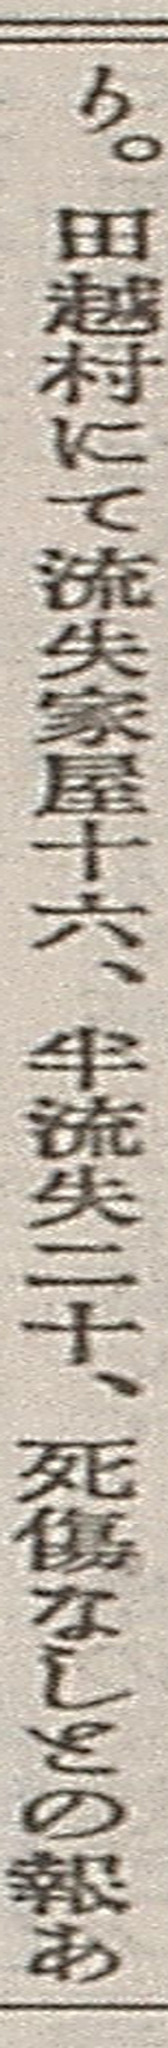り。田越村にて流失家屋十六、半流失二十、死傷なしとの報あ
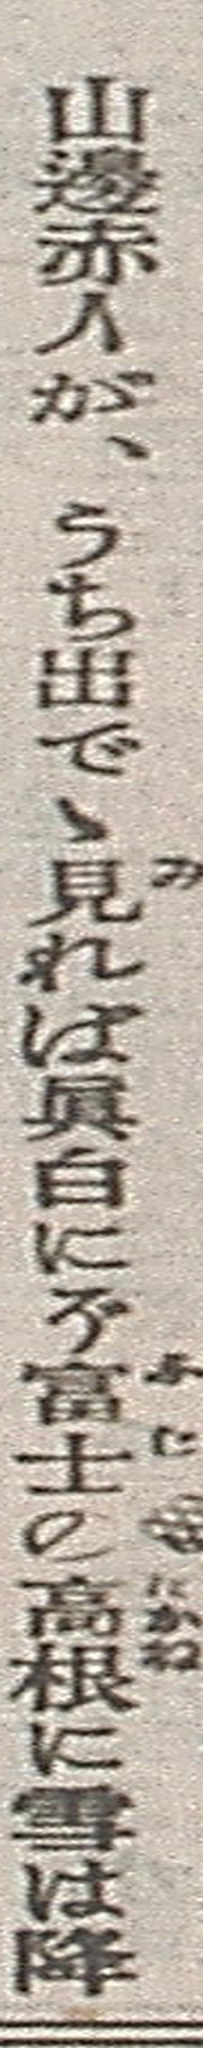山辺赤人が、うち出でゝ見れば真白にぞ富士の高根に雪は降
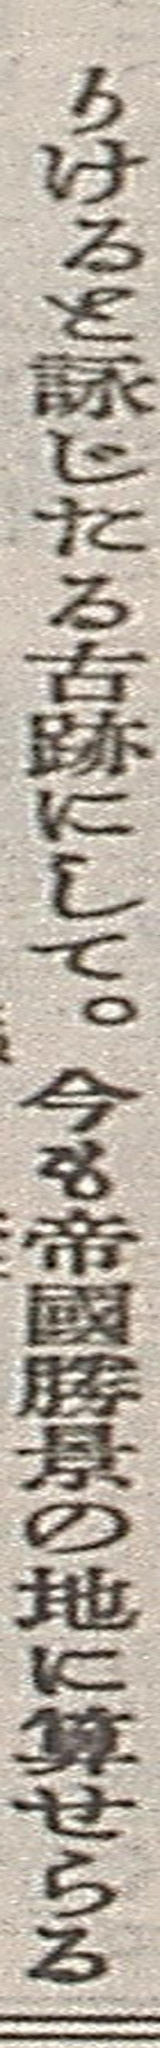りけると詠じたる古跡にして。今も帝国勝景の地に算せらる
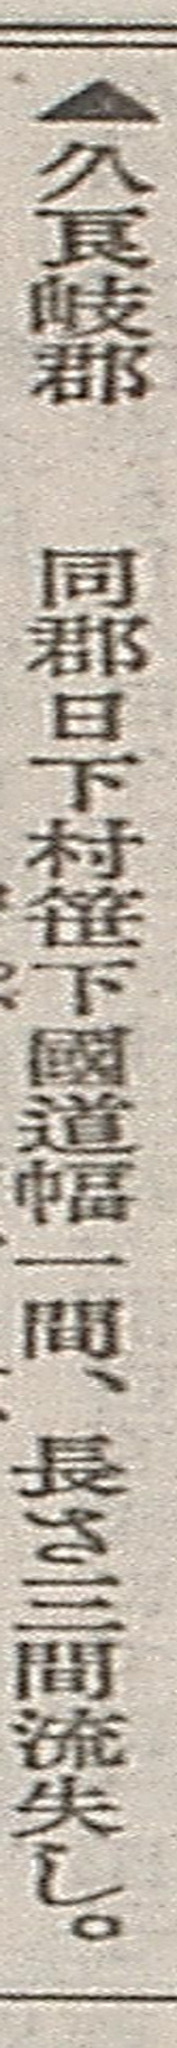▲久良岐郡同郡日下村笹下国道幅一間、長さ三間流失し。
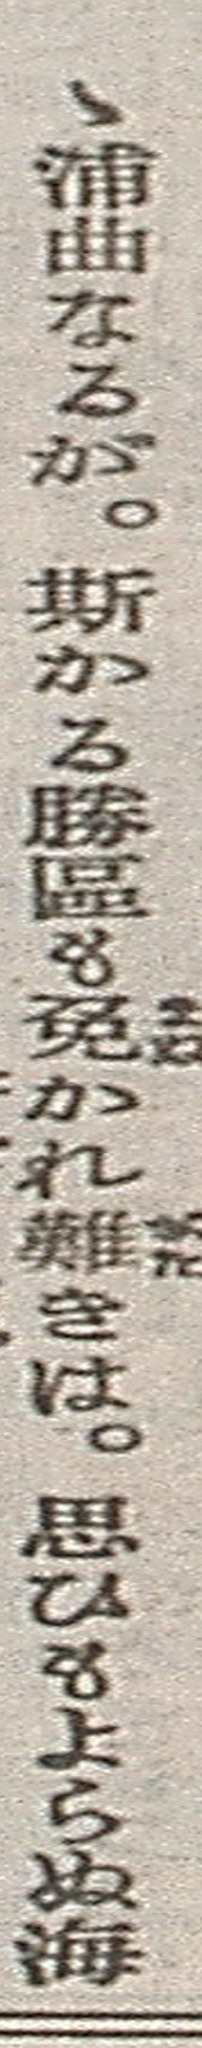ゝ浦曲なるが。斯かる勝区も免かれ難きは。思ひもよらぬ海
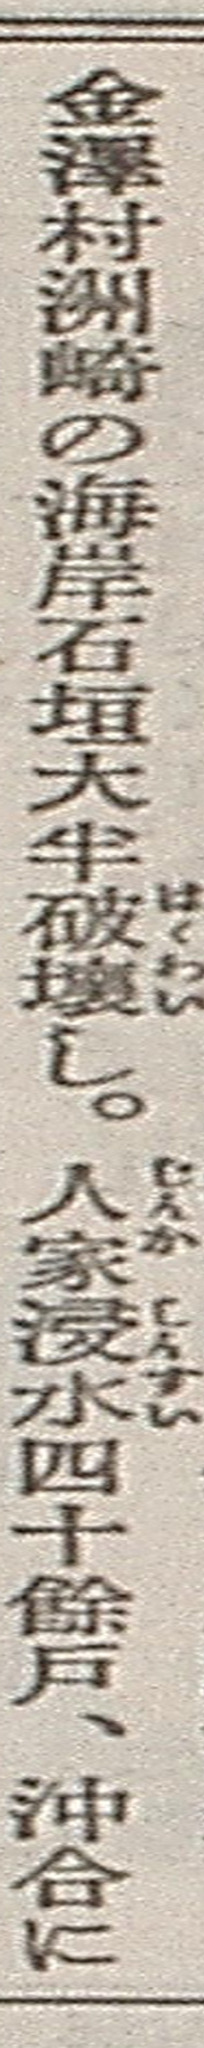金沢村洲崎の海岸石垣大半破壊し。人家浸水四十余戸、沖合に
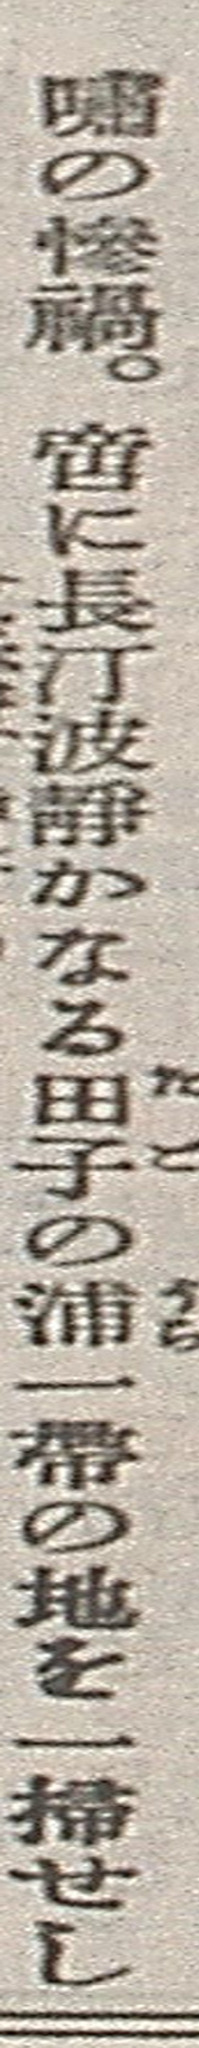嘯の惨禍。啻に長汀波静かなる田子の浦一帯の地を一掃せし
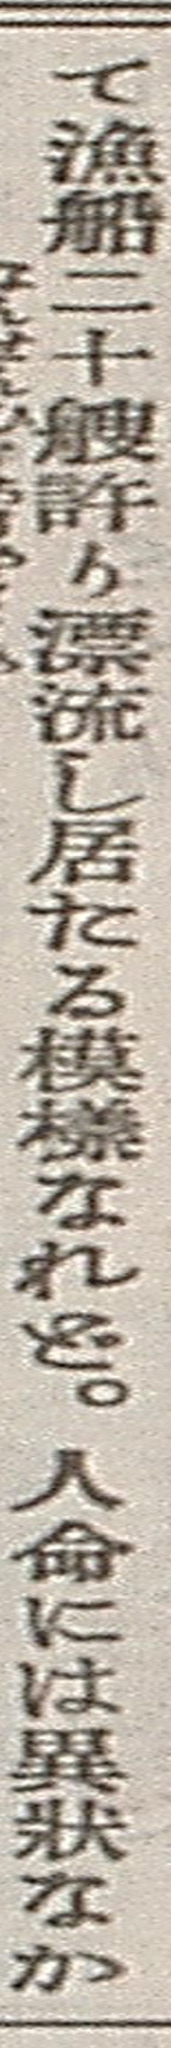て漁船二十艘許り漂流し居たる模様なれど。人命には異状なか
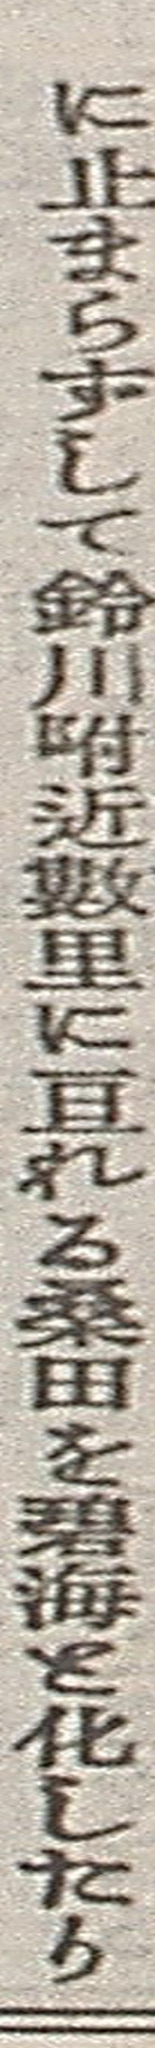に止まらずして鈴川附近数里に亘れる桑田を碧海と化したり
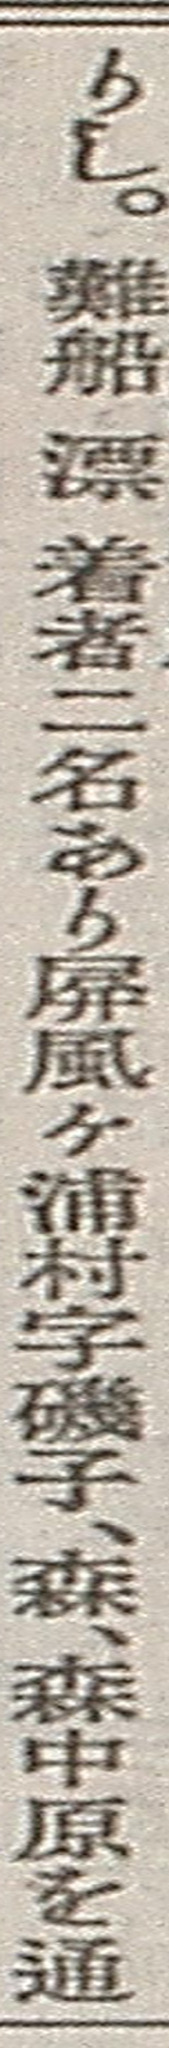りし。難船漂着者二名あり屛風ケ浦村字磯子、森、森中原を通
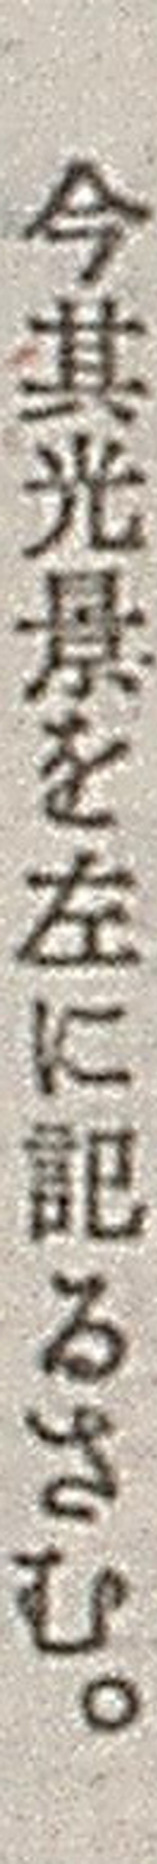今其光景を左に記るさむ。
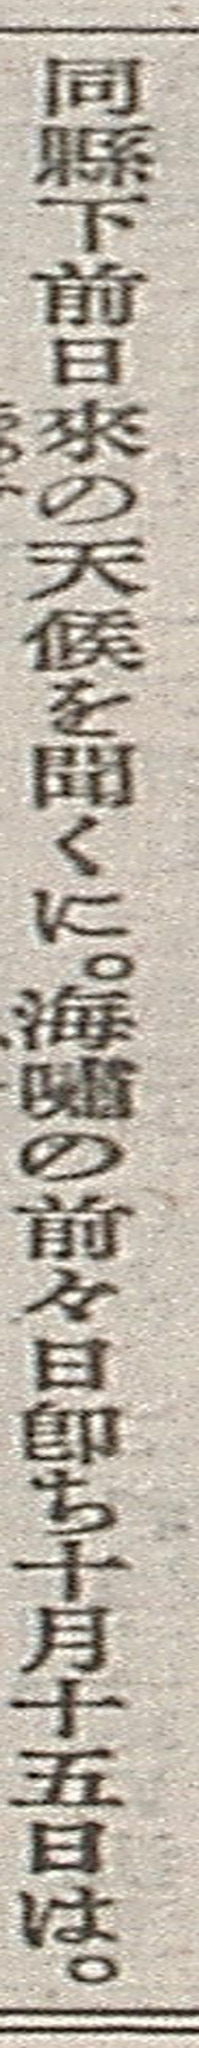同県下前日来の天候を聞くに。海嘯の前々日即ち十月十五日は。
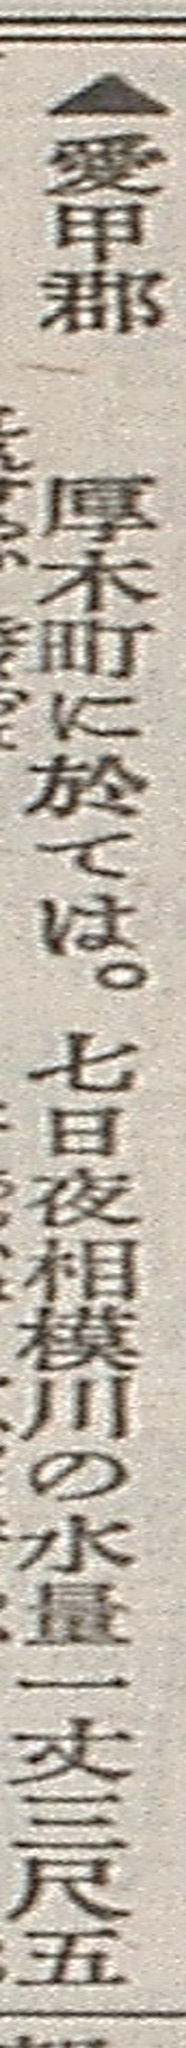▲愛甲郡厚木町に於ては。七日夜相模川の水量一丈三尺五
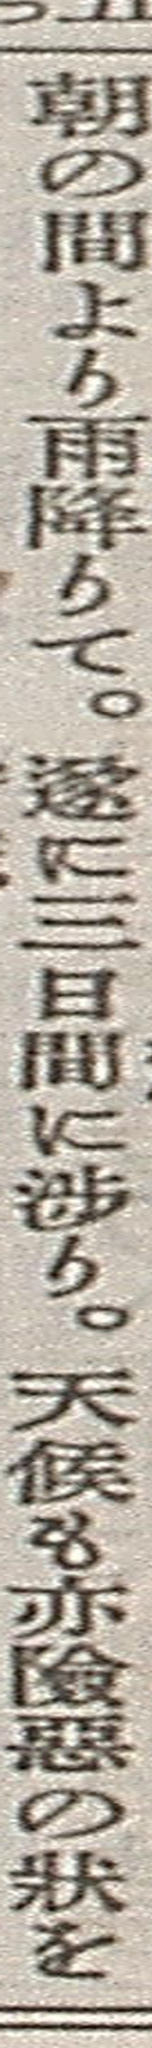朝の間より雨降りて。遂に三日間に渉り。天候も亦険悪の状を
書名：風俗畫報臨時増刊第百九十九號　明治三十二年十月各地災害圖會（前編之續）
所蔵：東京大学地震研究所図書室 Earthquake Research Institute Library, The University of Tokyo, JAPAN
